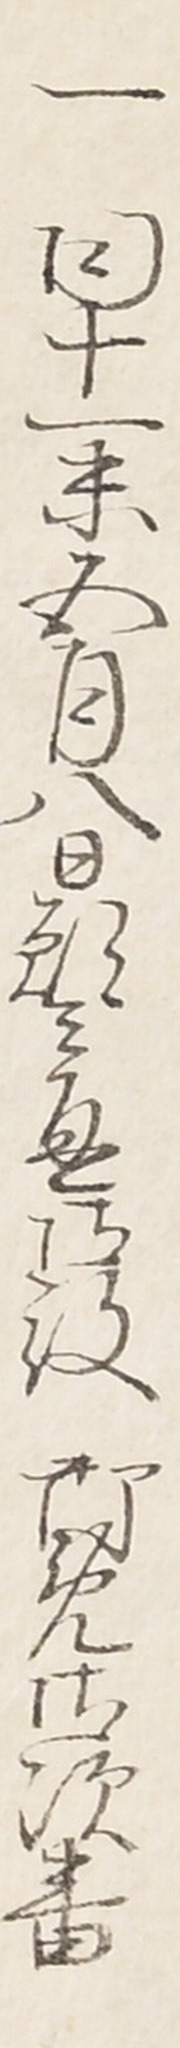一同十一未五月八日願之御役御免御次番
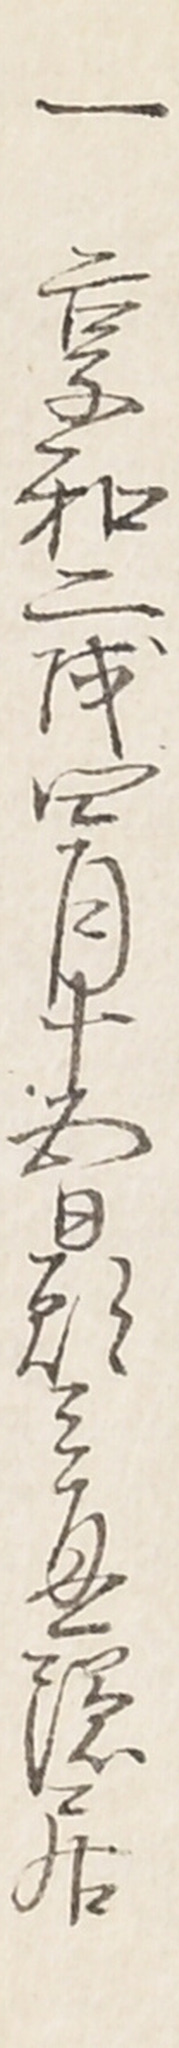一享和二戌四月十五日願之通隠居
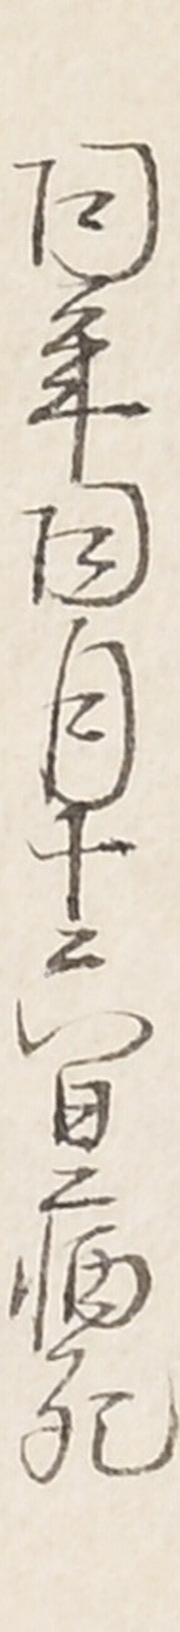一同年同月十六日病死
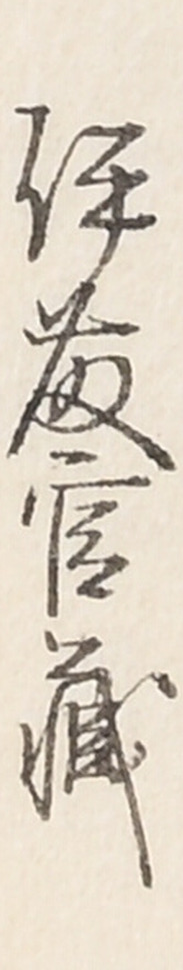伊藤官蔵
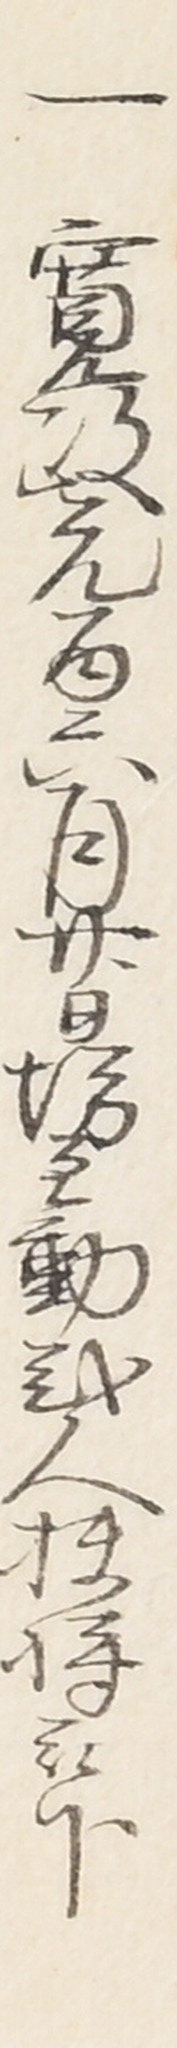一寛政元酉六月廿日坊主勤弐人扶持被下
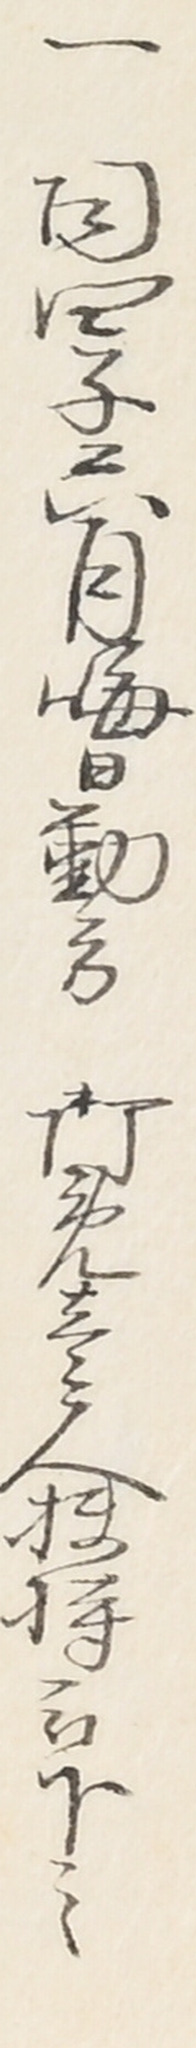一同四子六月晦日勤方御免壱人扶持被下之
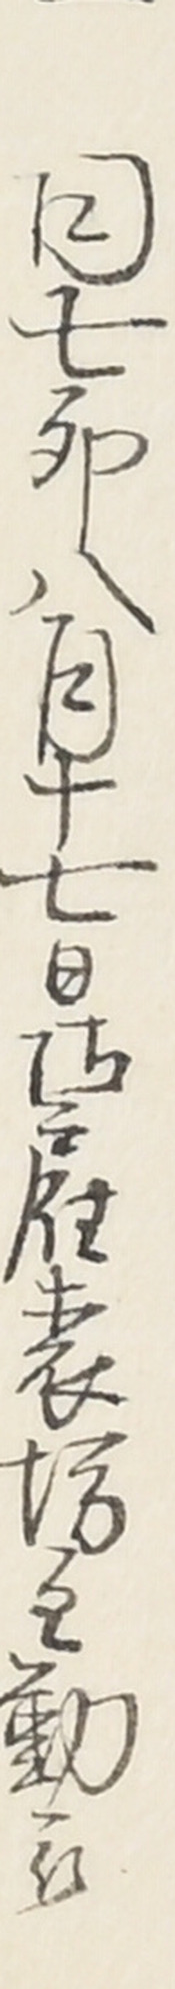一同七卯八月十七日御雇表坊主勤被
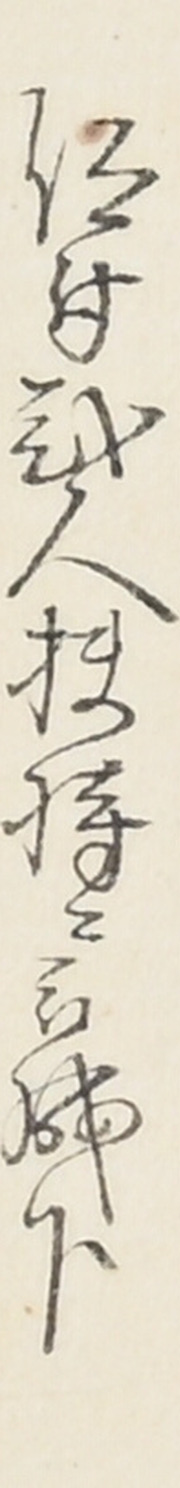仰付弐人扶持ニ被成下
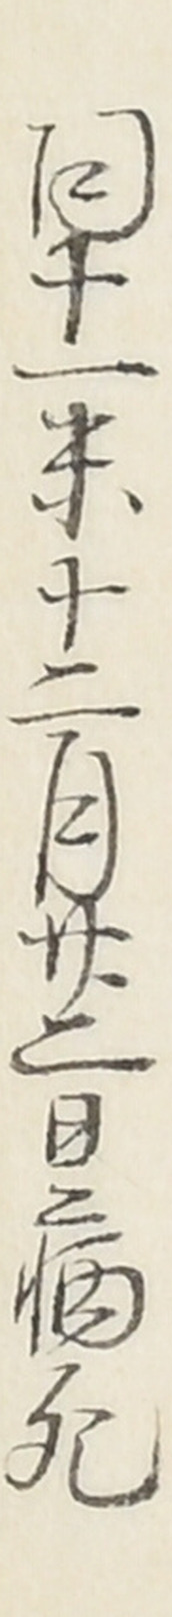一同十一未十二月廿二日病死
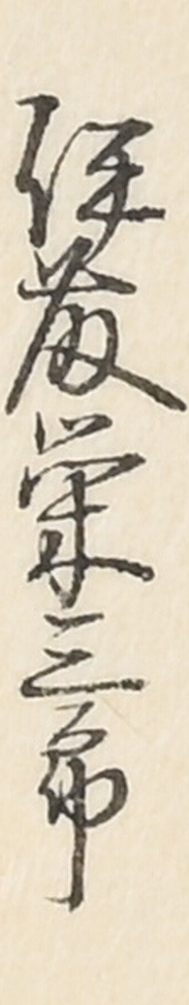伊藤栄三郎
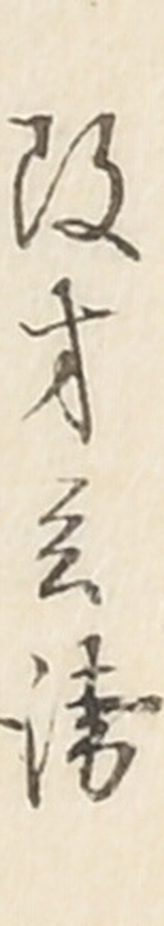改才兵衛
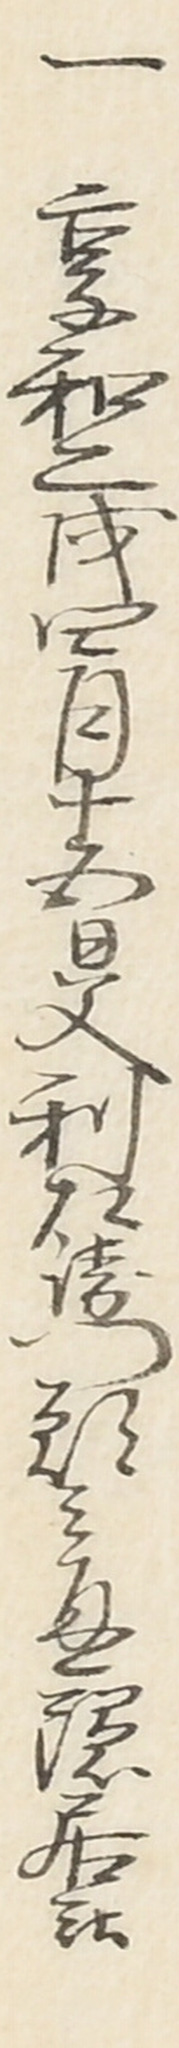一享和二戌四月十五日父利左衛門願之通隠居被
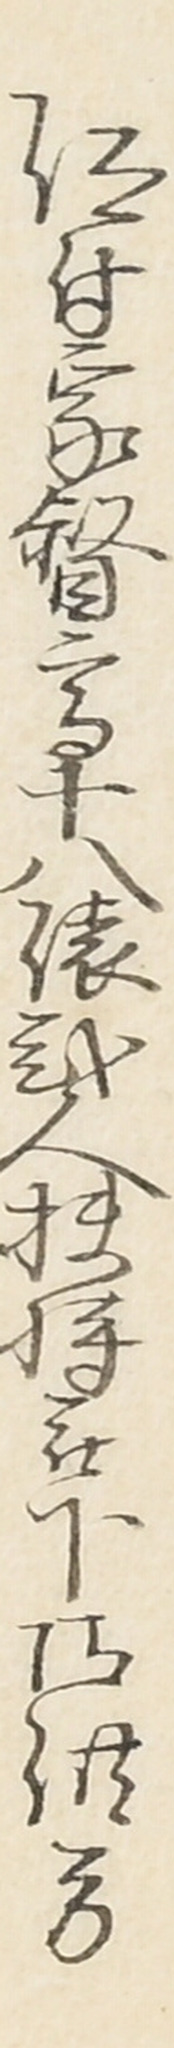仰付家督高十八俵弐人扶持被下御供方
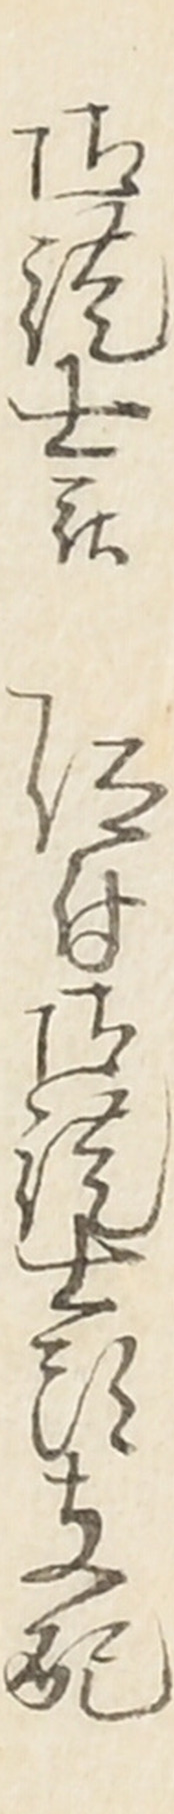御徒士被仰付御徒士頭支配
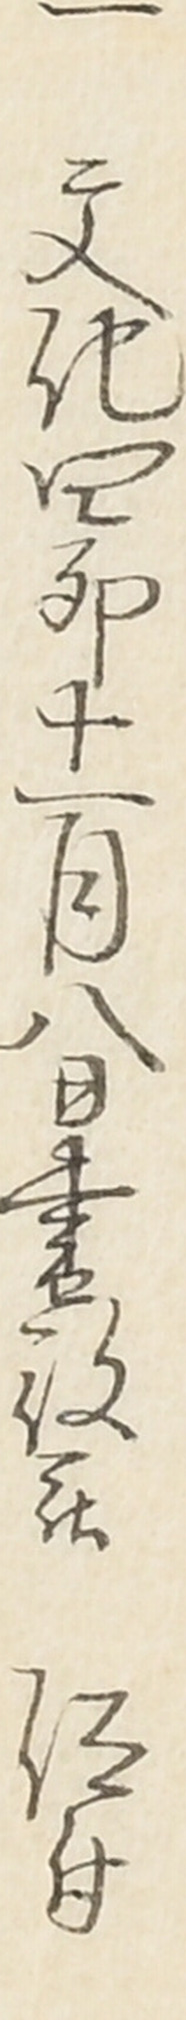一文化四卯十一月八日書役被仰付
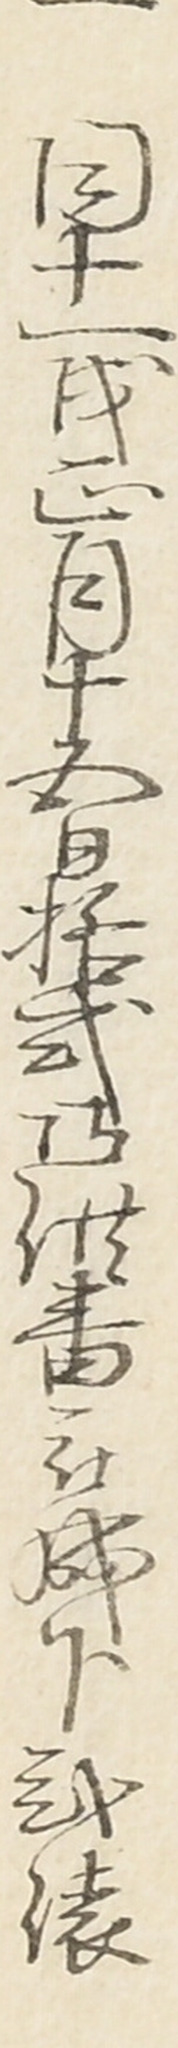一同十一戌正月十五日格式御供番被成下弐俵
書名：無足諸士勤仕録（四）
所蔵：伊那市立高遠町図書館・合同会社AMANE
